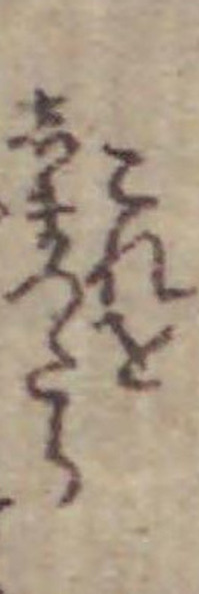しまつたら
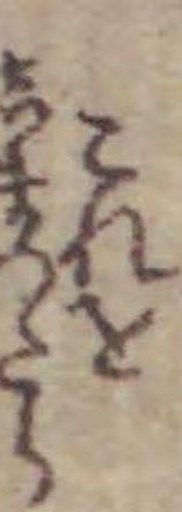しまつたら
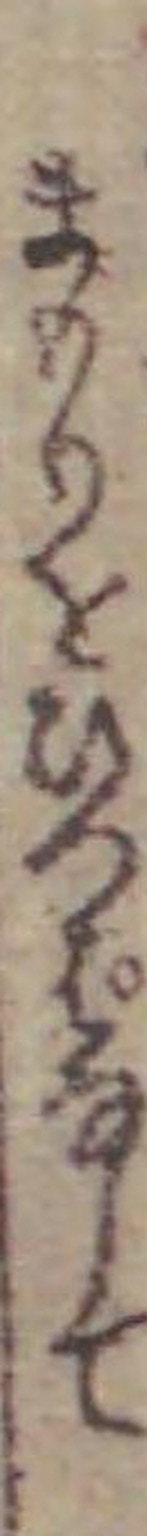まもりをひつぱなして
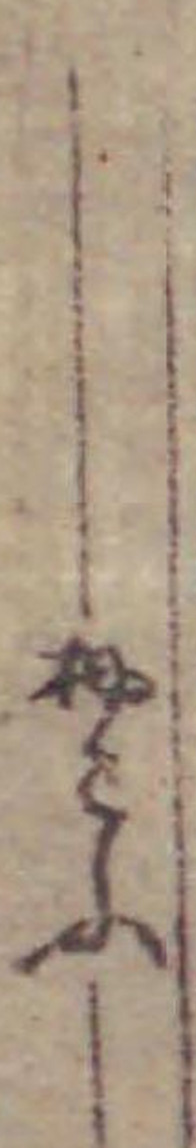おこふ
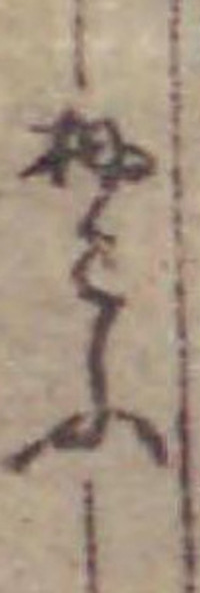おこふ

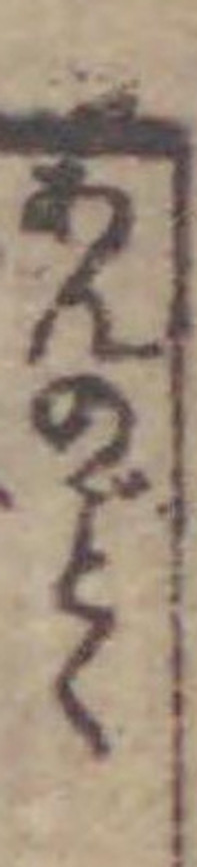あんのごとく
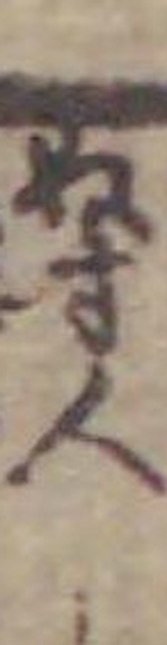ぬす人
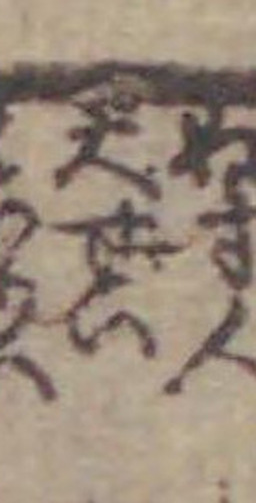大ぜい
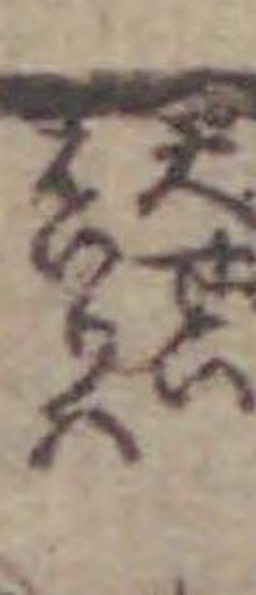はいりは
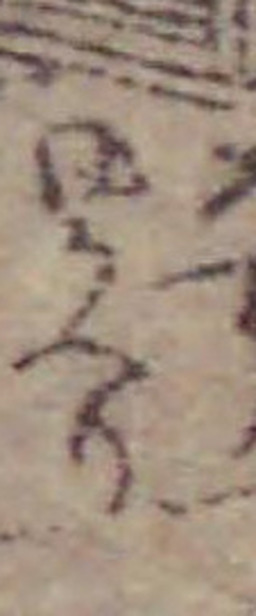御かへり
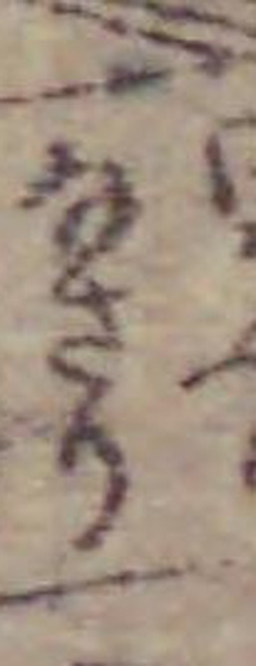なさり
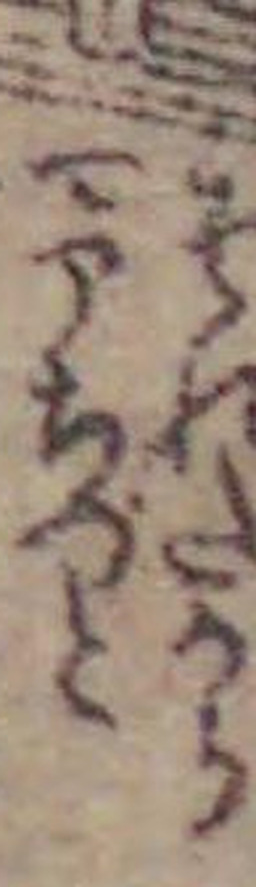マアちつと
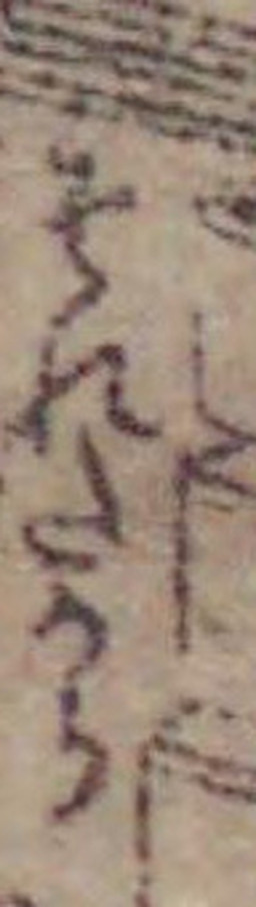それたから
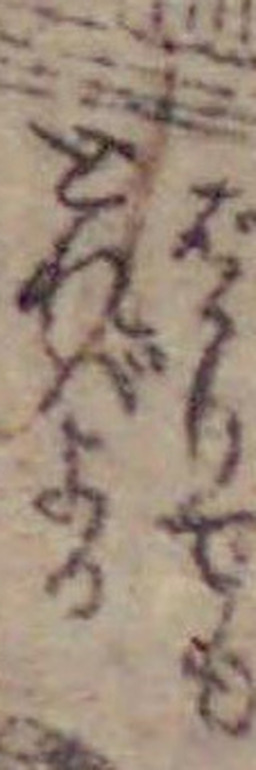とればよか
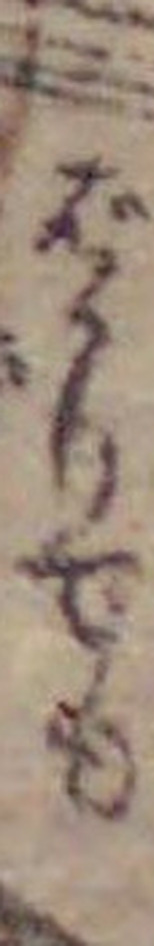ばかりでも
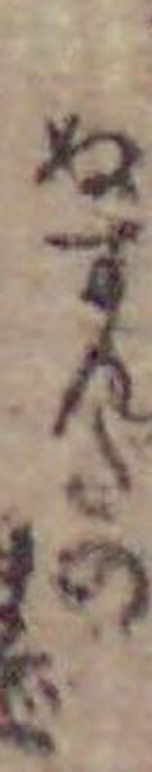ぬすんだの
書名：莫切自根金生木 : 3巻
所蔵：国立国会図書館 National Diet Library, JAPAN
